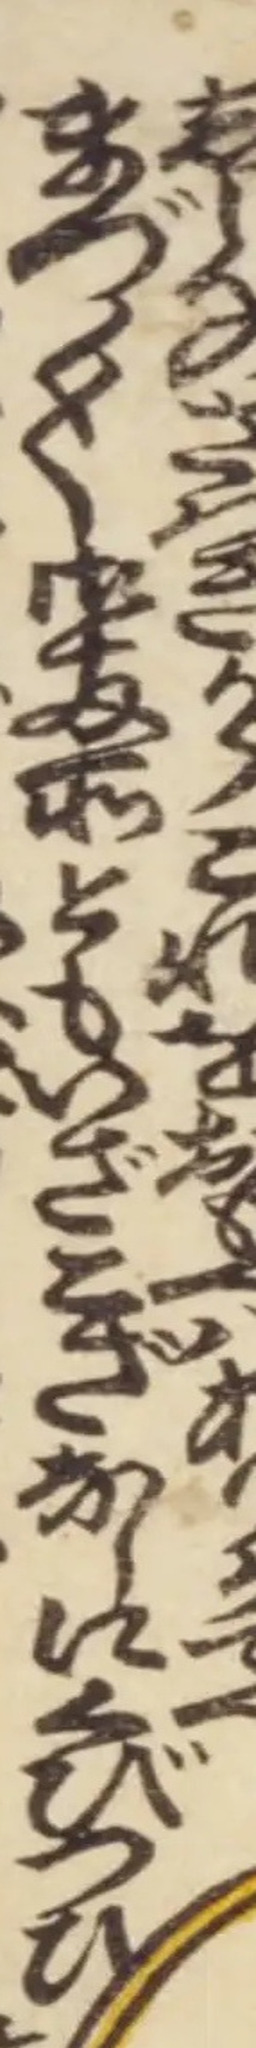まづ〳〵〳〵御両所ともいざこざなしにくびつひき
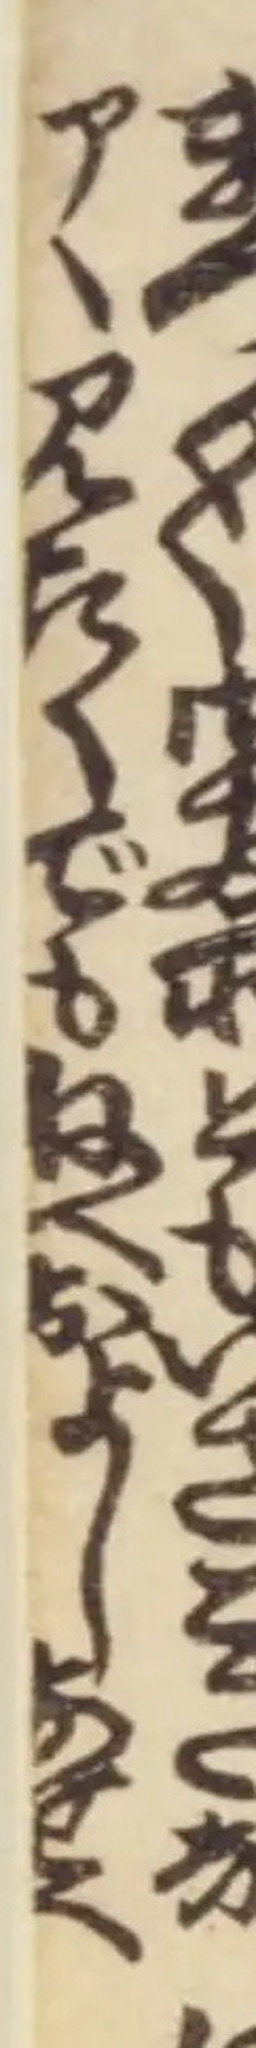アヽみたくでもねへおよしなせへ
